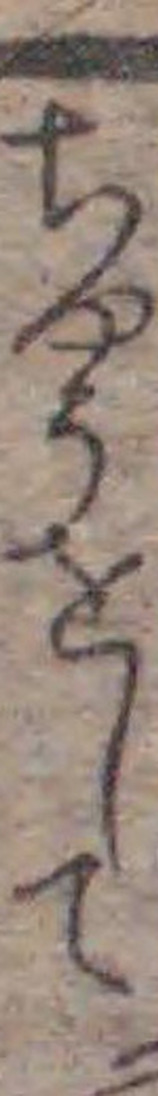ちやうをして
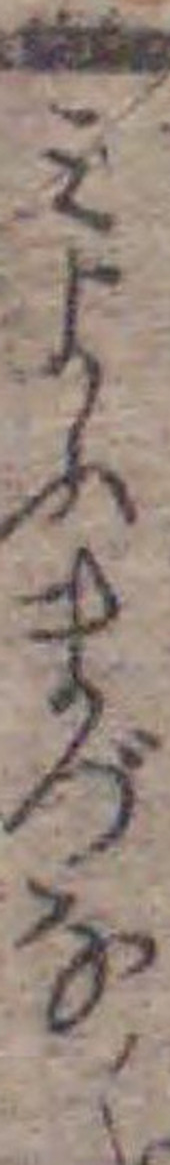みよふまづな
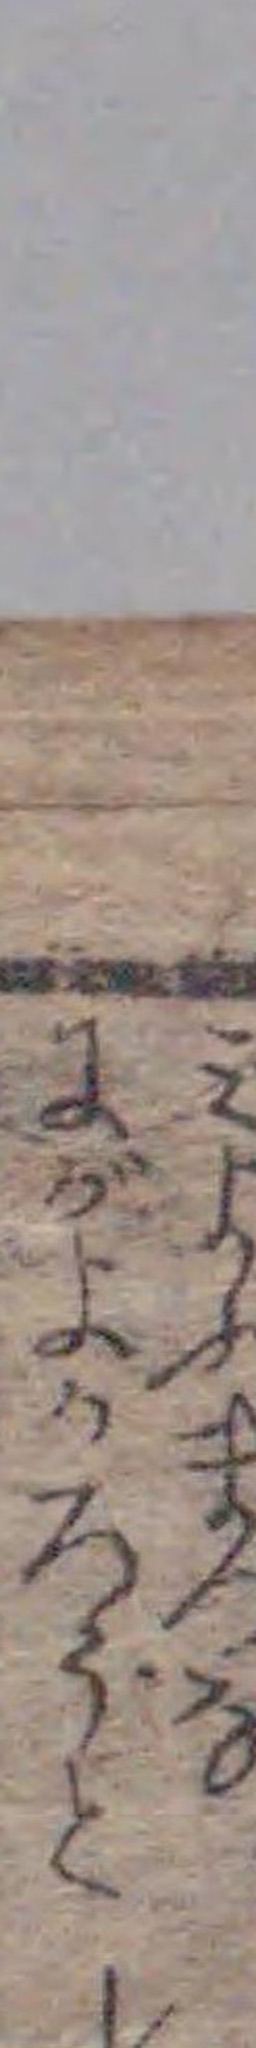にがよかろうと
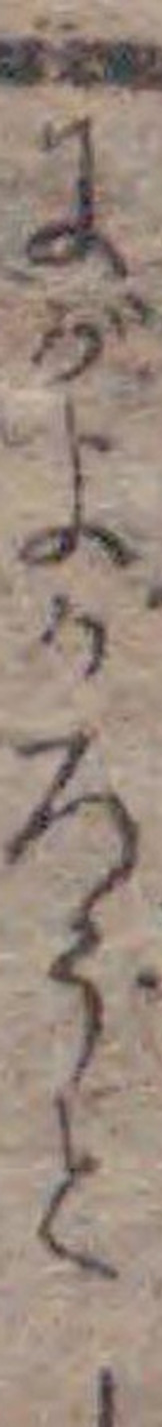にがよかろうと
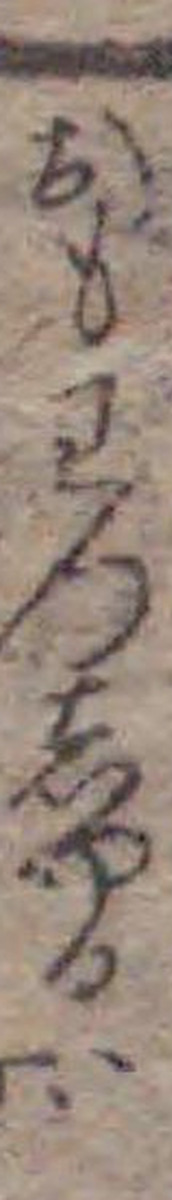おもわつしやる
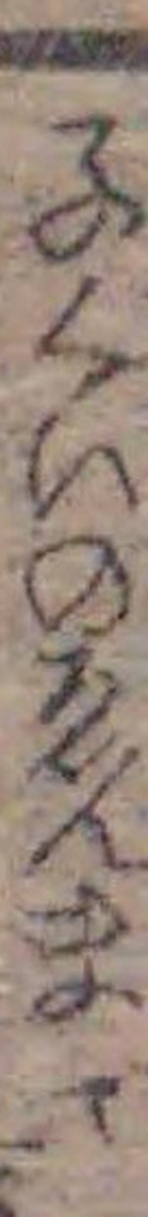子くいのゑんま
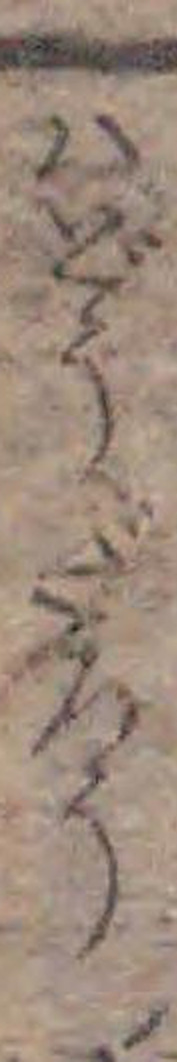はどうだろう

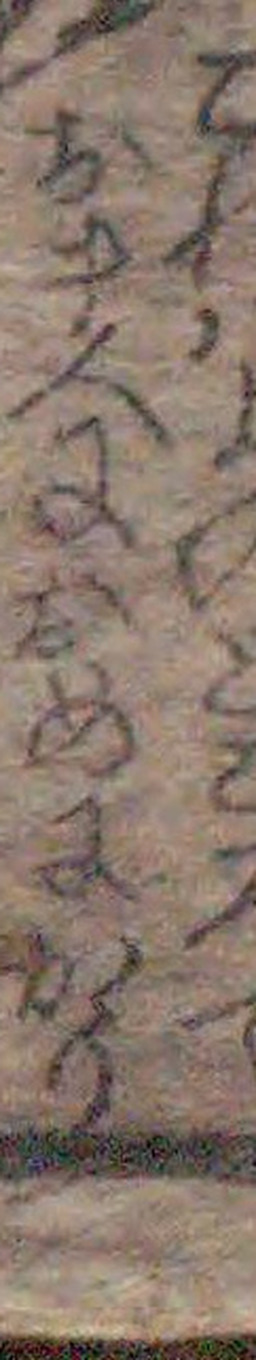おまへにおめにかゝり
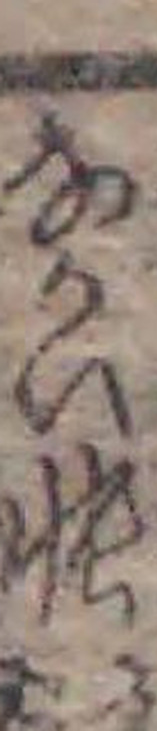なかい帳
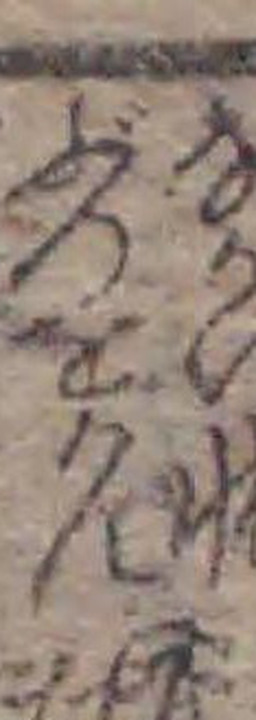ぶつをかん
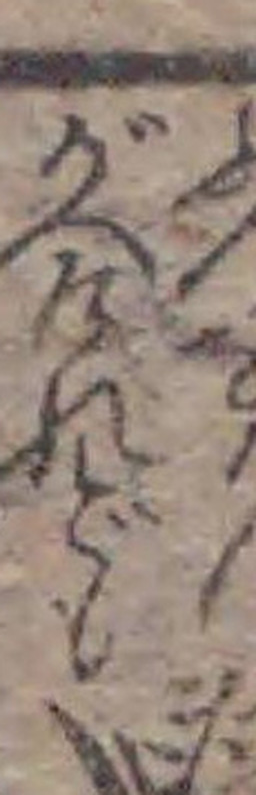がへけれども
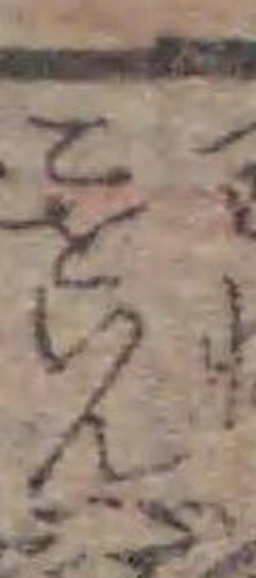こをいん
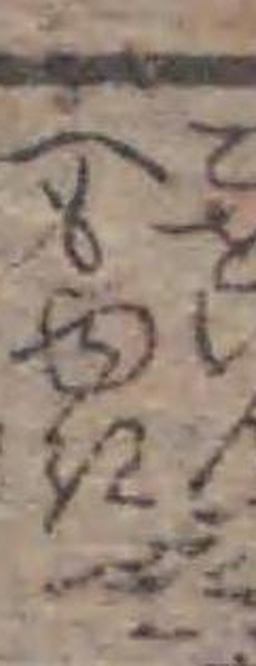へもゆき
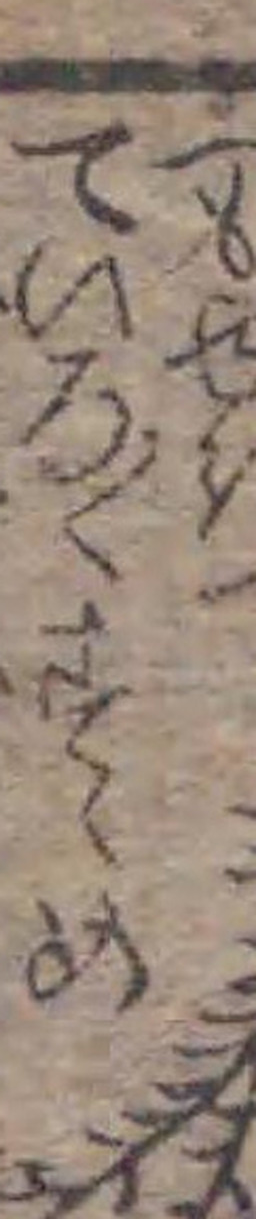ていろ〳〵すゝめ
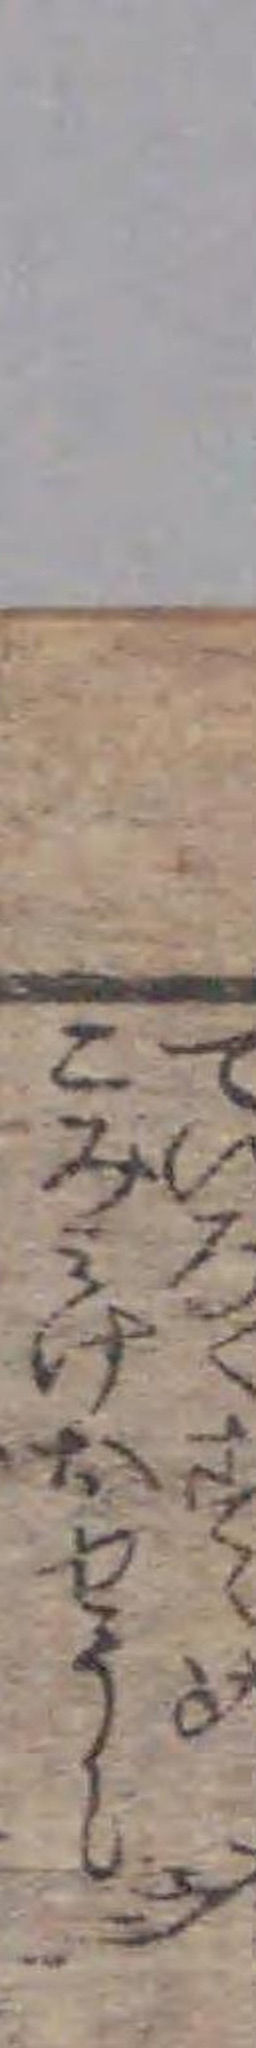こみみけおせうも
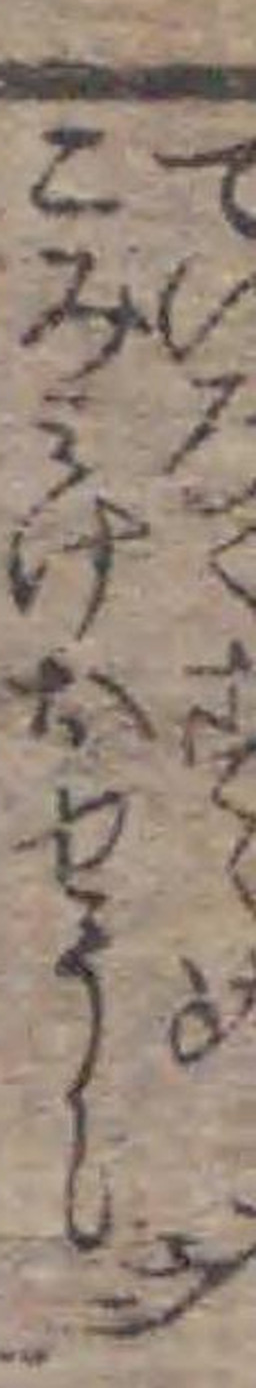こみみけおせうも
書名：化物七段目 : 2巻
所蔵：国立国会図書館 National Diet Library, JAPAN
